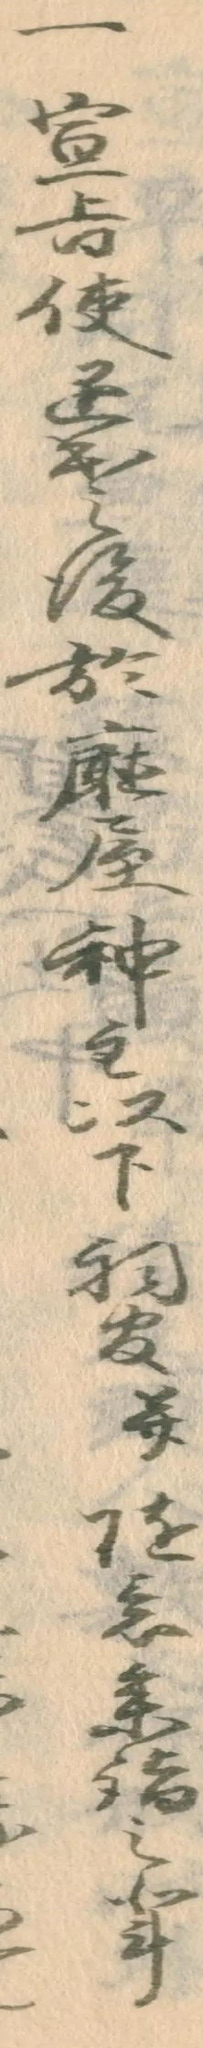一宣旨使退出之後於庁屋神主以下祠官并随意参詣之輩
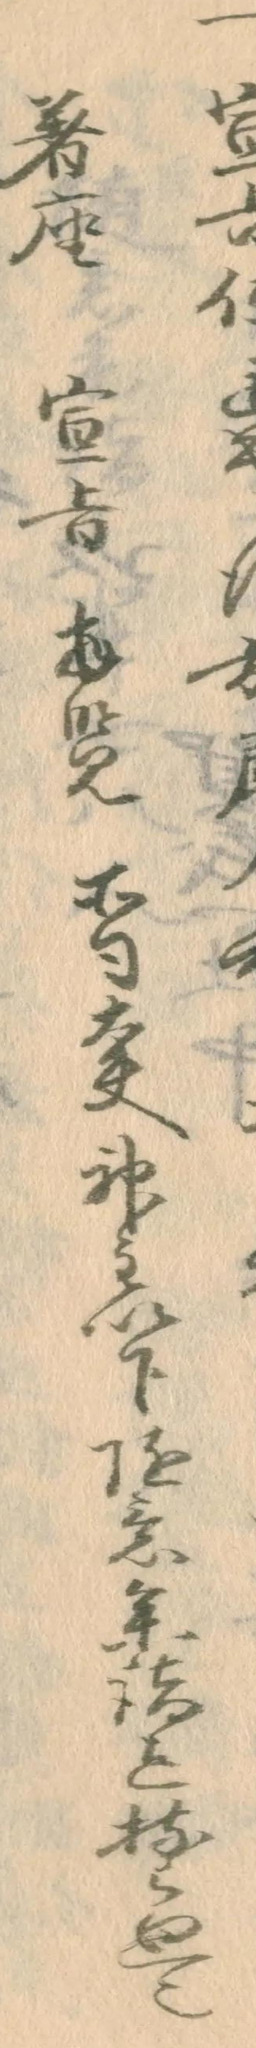着座宣旨拝覧所司大夫神主以下随意参詣迄持被廻也
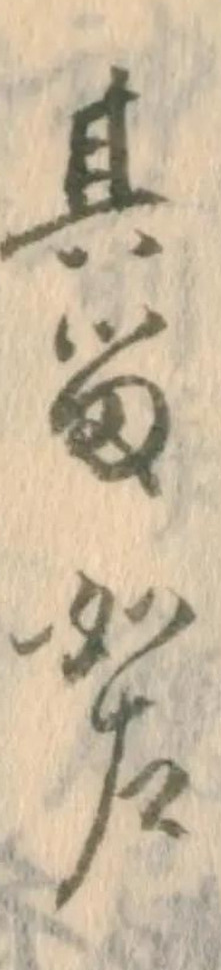其留如左
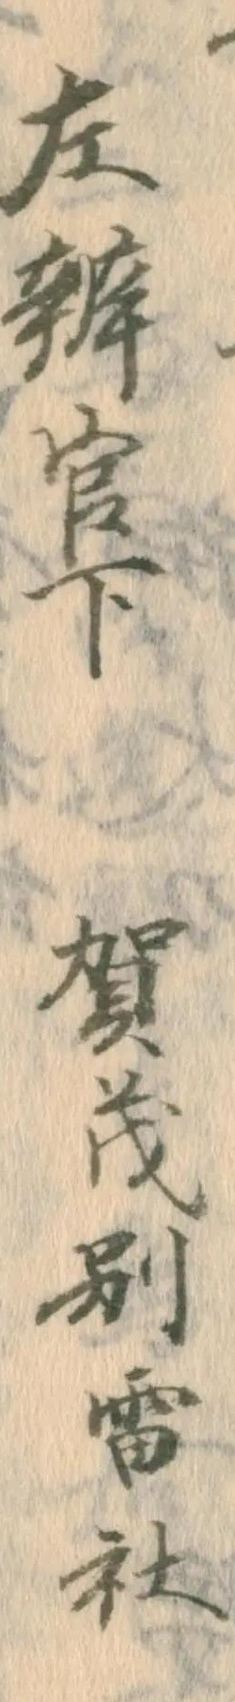左弁官下賀茂別雷社
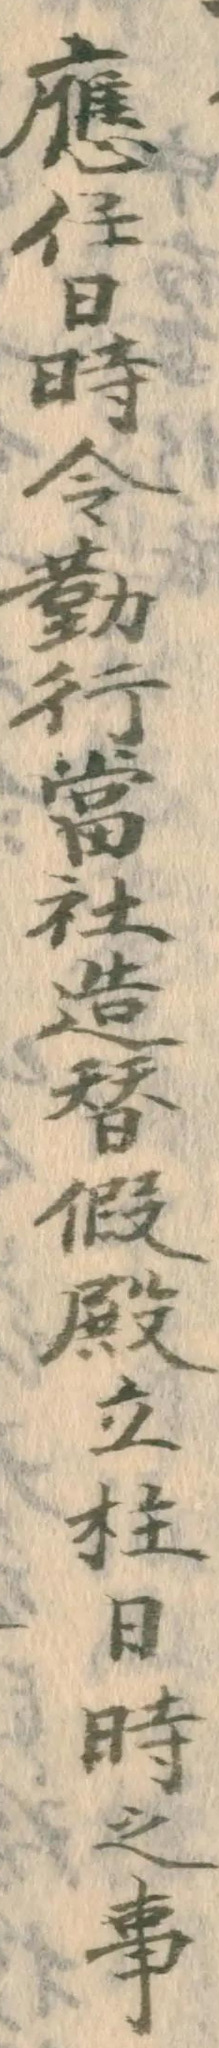応任日時令勤行当社造替仮殿立柱日時之事
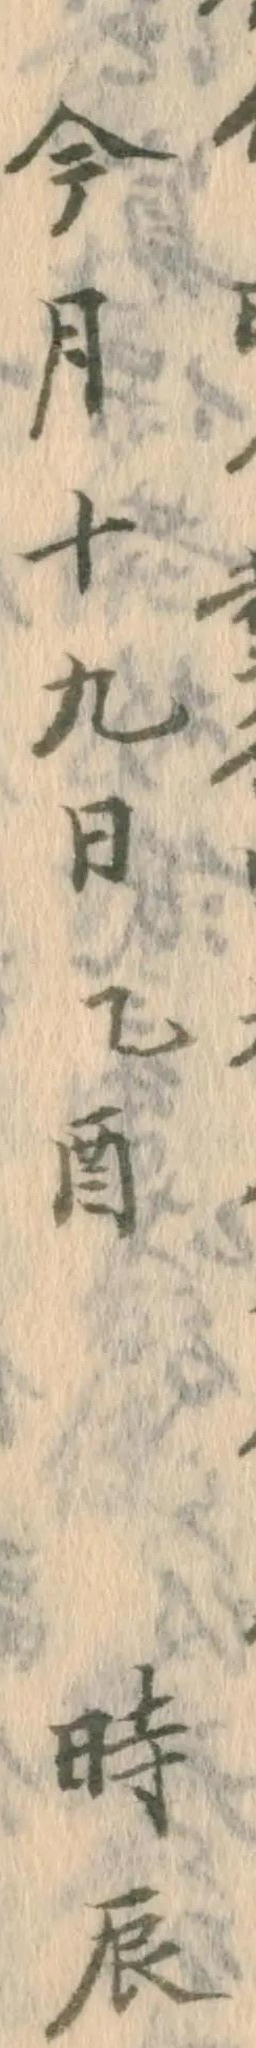今月十九日乙酉時辰
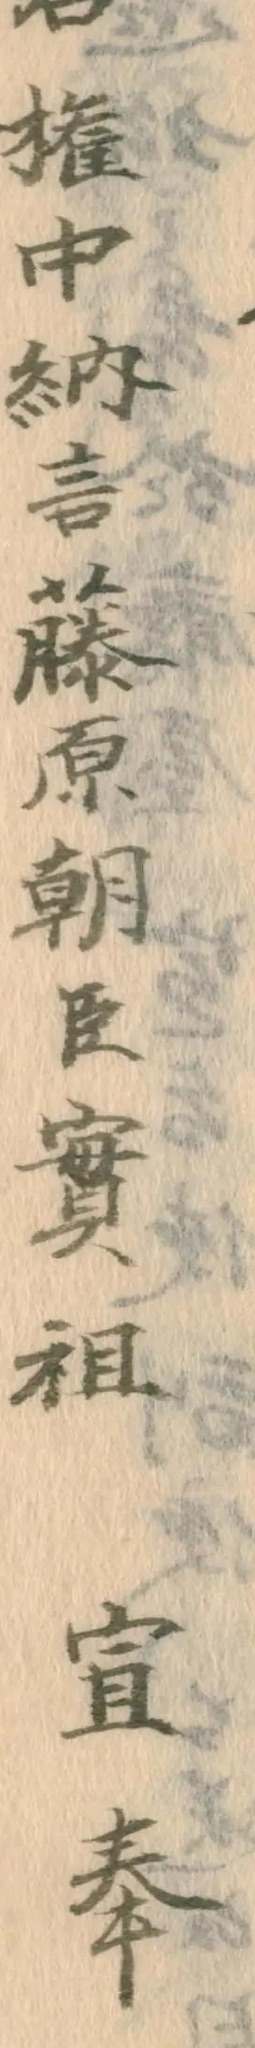右権中納言藤原朝臣実祖宣奉
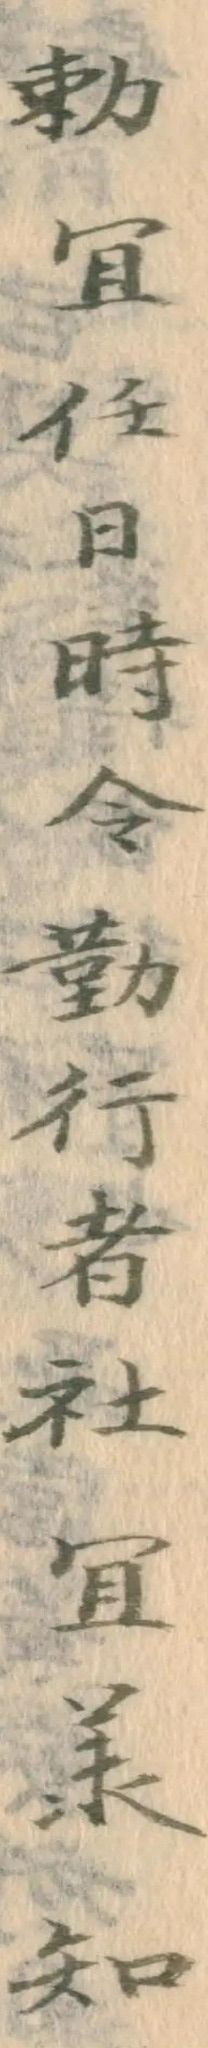勅宜任日時令勤行は社宜承知
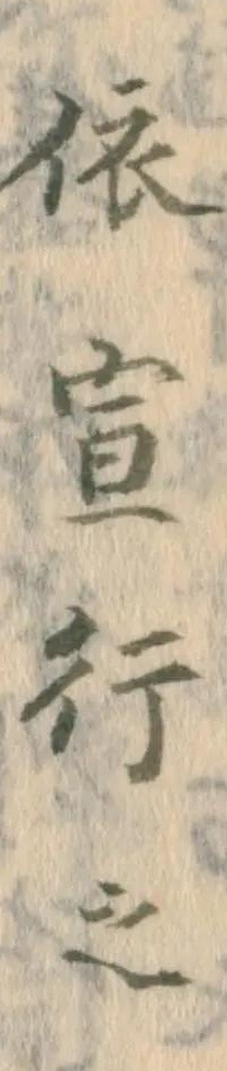依宣行之
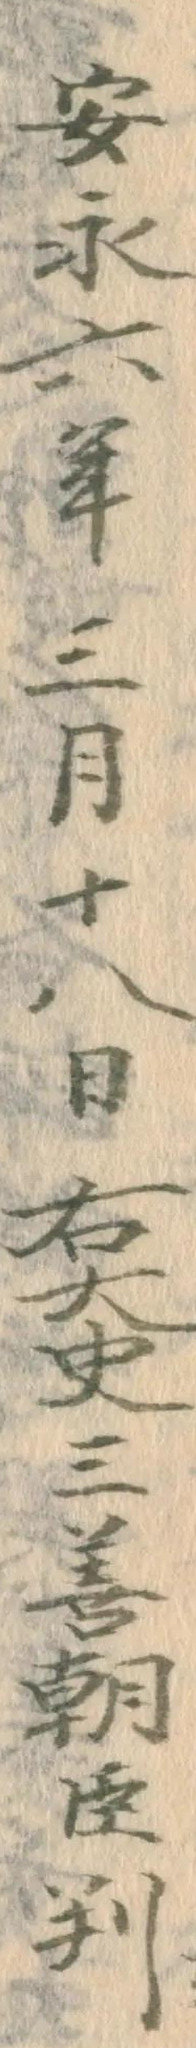安永六年三月十八日右大史三善朝臣判奉
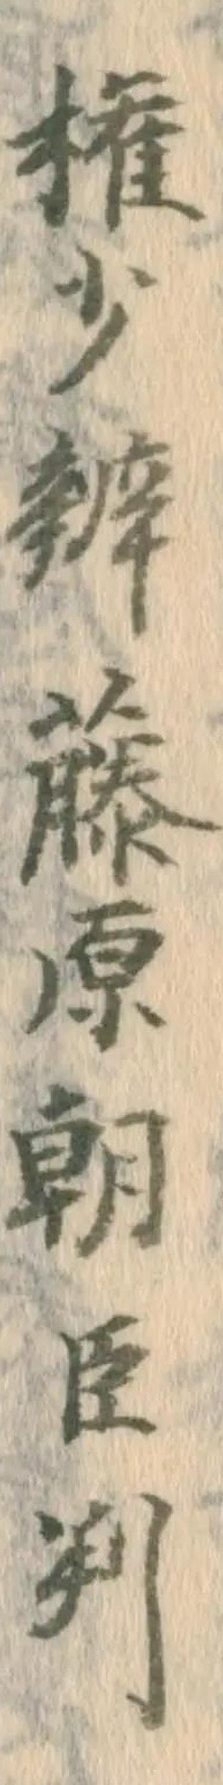権少弁藤原朝臣判
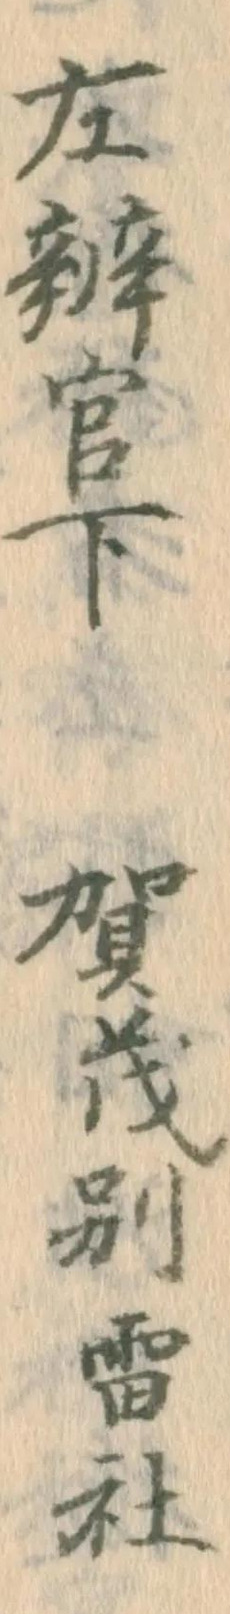左弁官下賀茂別雷社
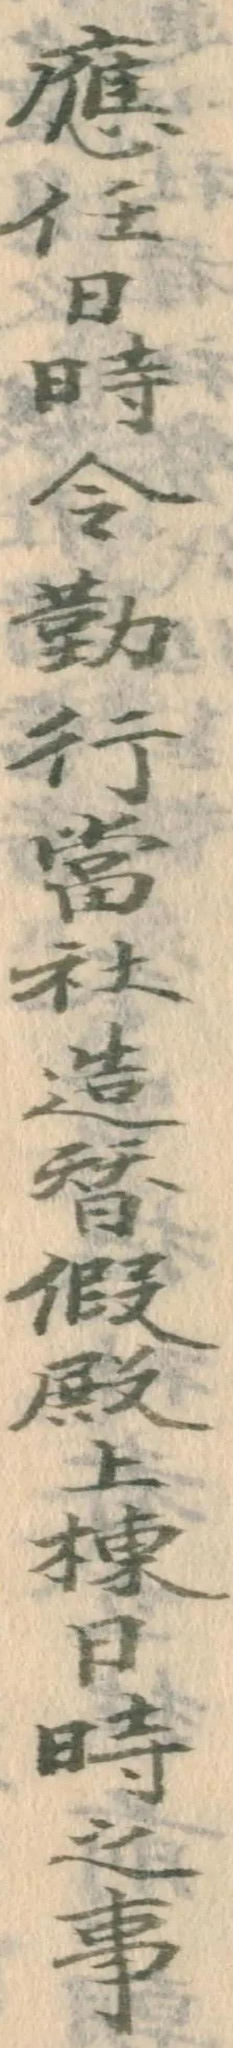応任日時令勤行当社造替仮殿上棟日時之事
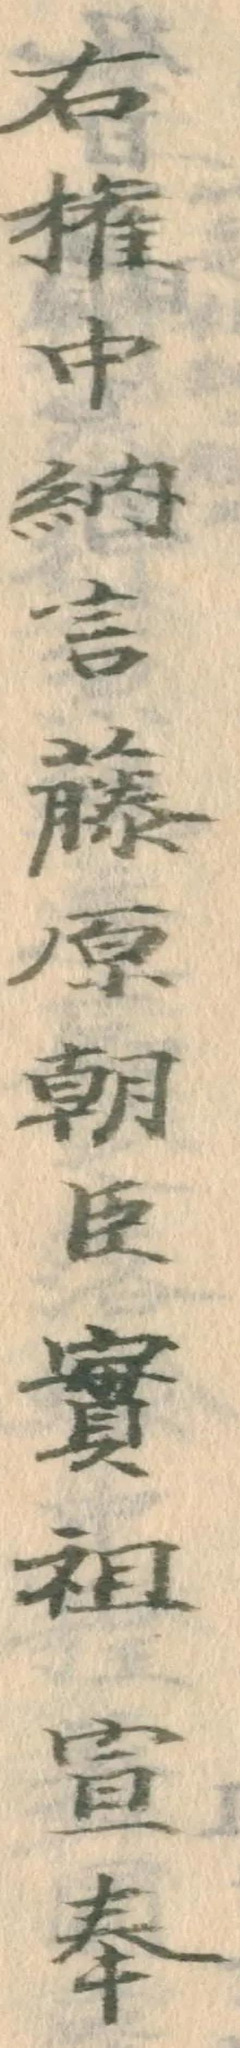右権中納言藤原朝臣実祖宣奉
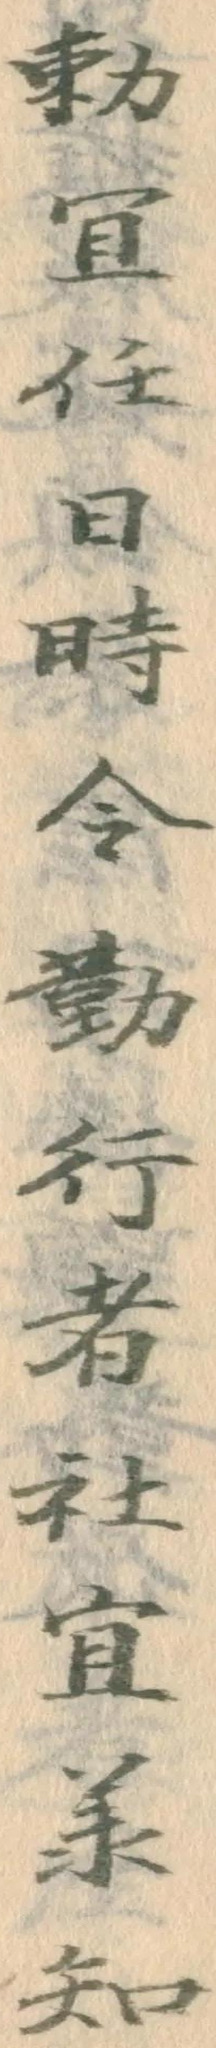勅宜任日時令勤行は社宜承知
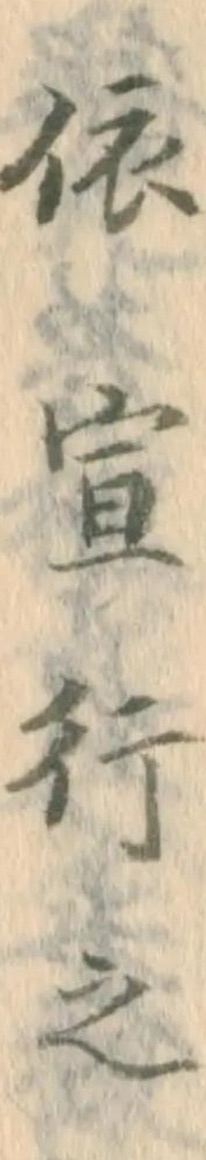依宣行之
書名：賀茂社記録. 第17冊
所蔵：国立国会図書館 National Diet Library, JAPAN
